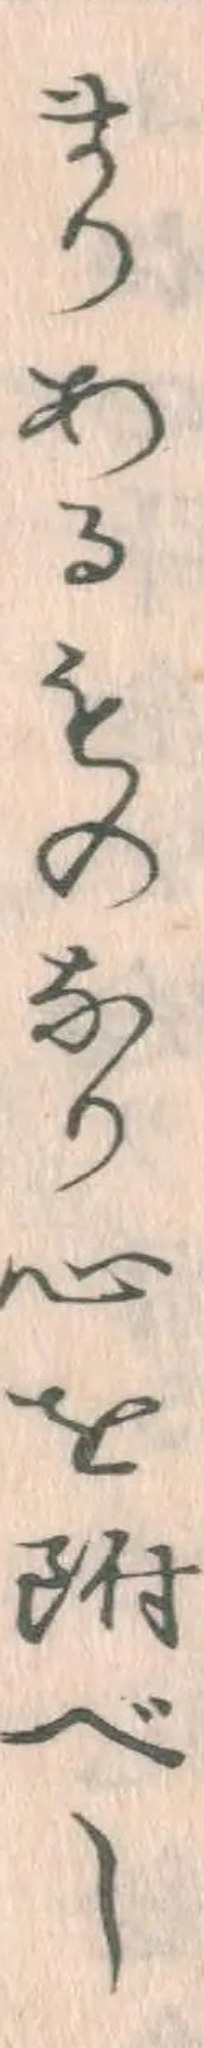まりあるものなり心を附べし
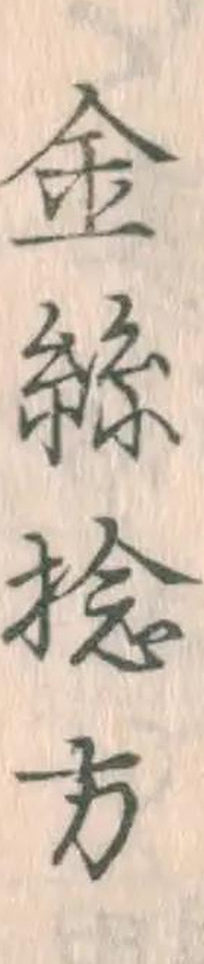金糸捻方
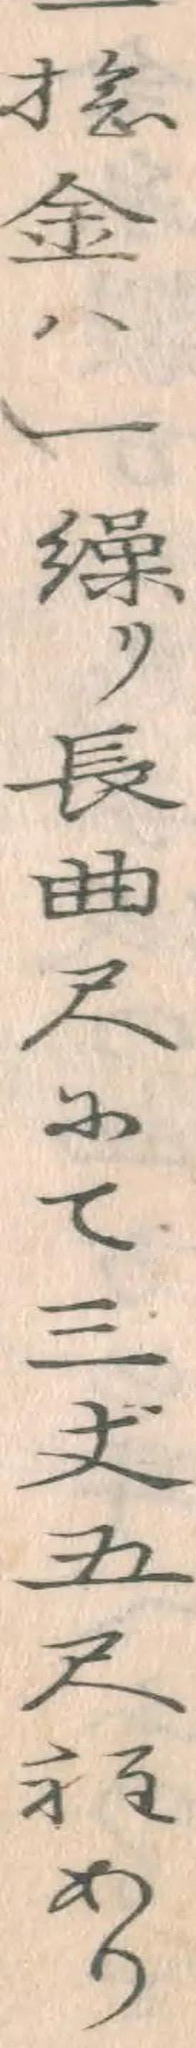一捻金は一繰り長曲尺にて三丈五尺程あり
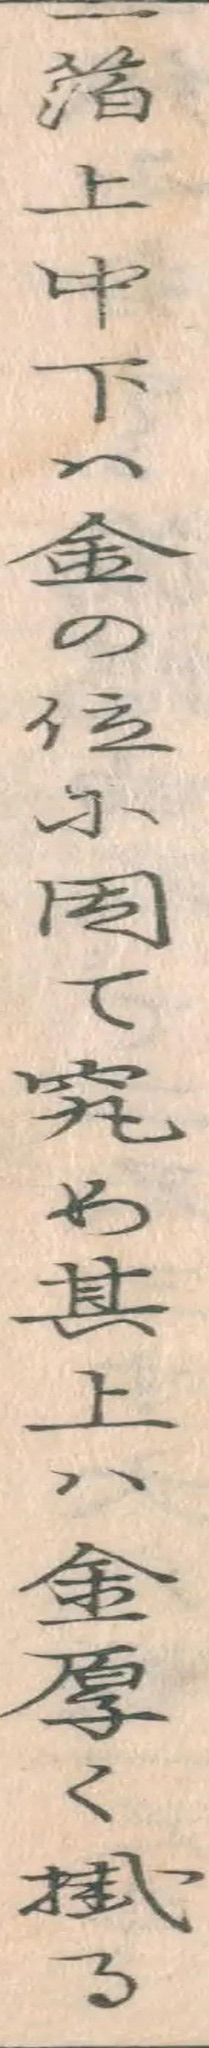一箔上中下は金の位に因て究め其上は金厚く掛る
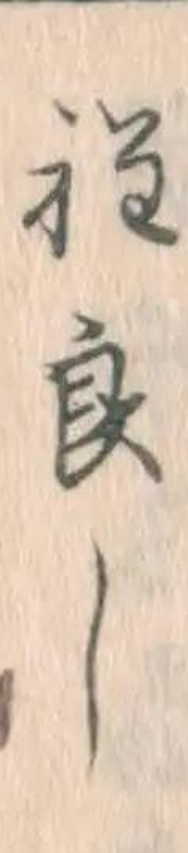程良し
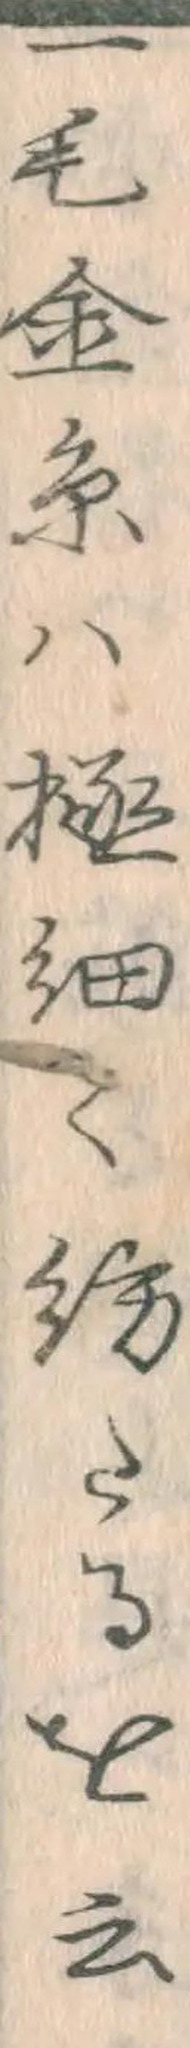一毛金糸は極細く紡たるを云

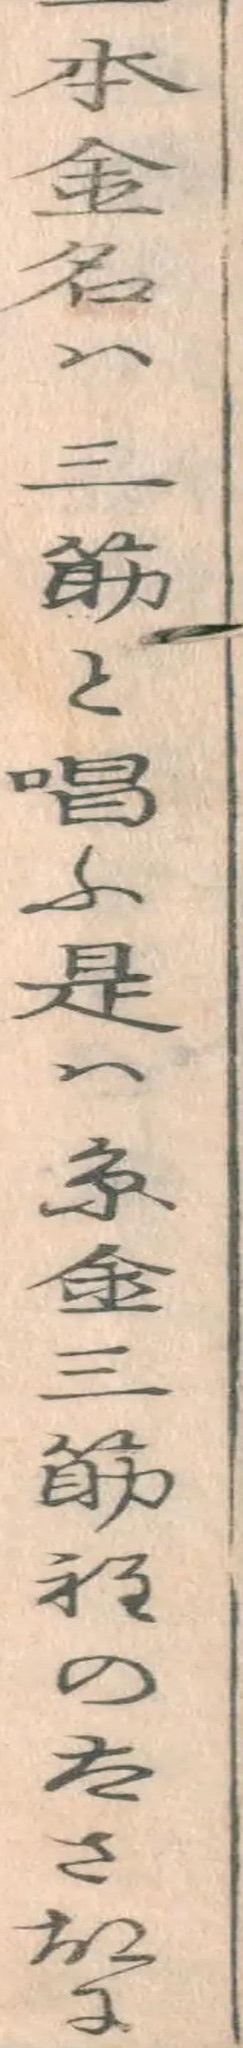一本金名は三筋と唱ふ是は糸金三筋程の太さ故に
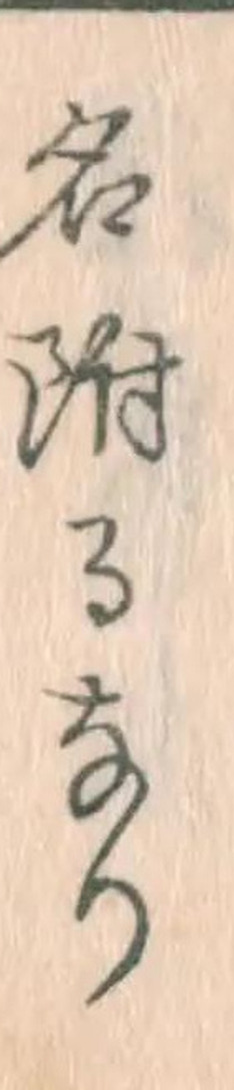名附るなり
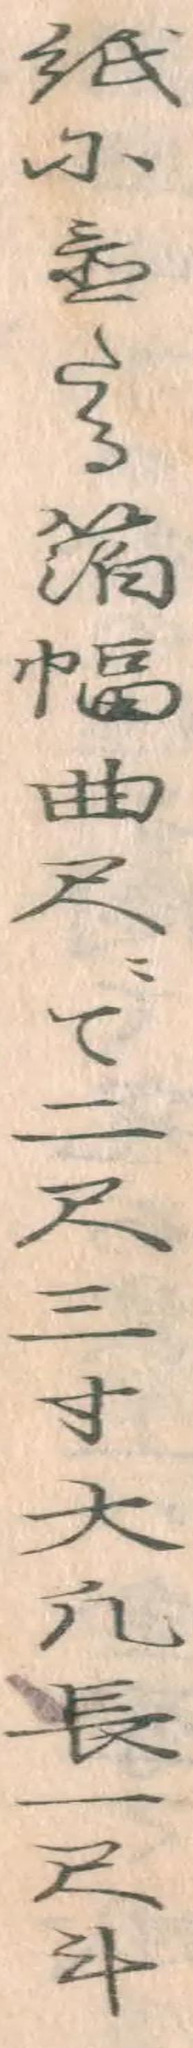一紙に置たる箔幅曲尺にて二尺三寸大凡長一尺斗
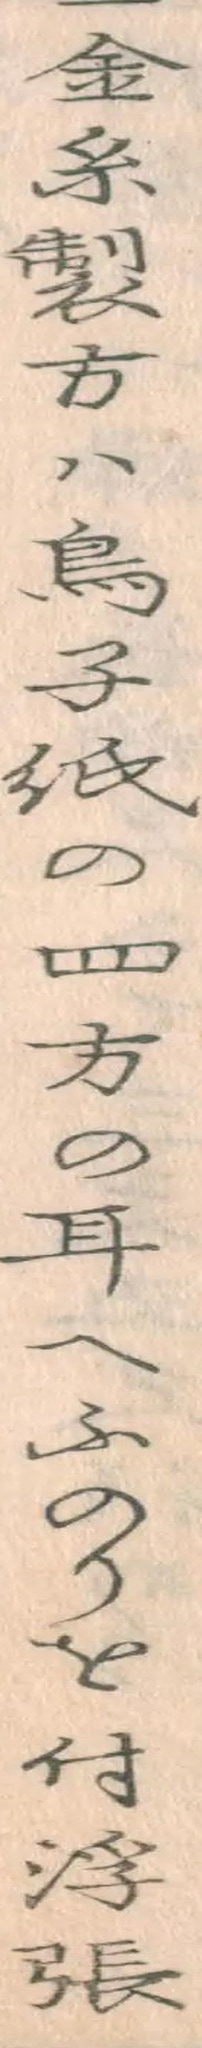一金糸製方は鳥子紙の四方の耳へふのりを付浮張
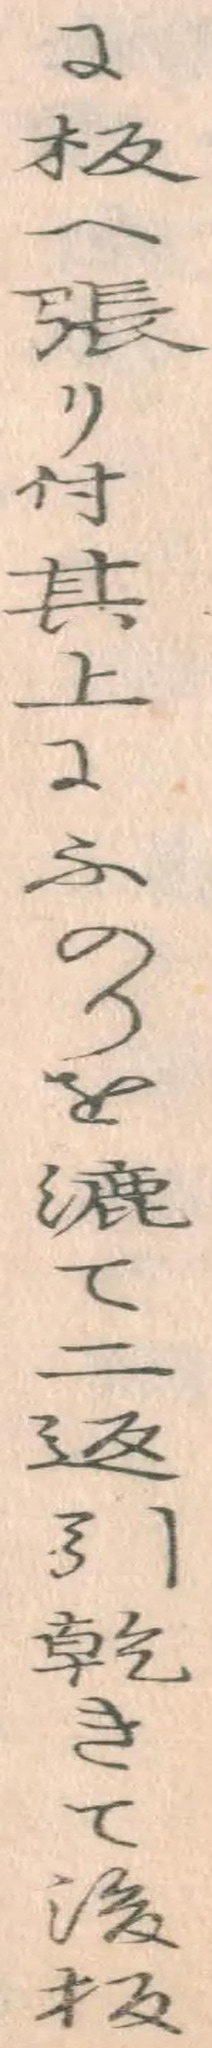に板へ張り付其上にふのりを漉て二返引乾きて後板
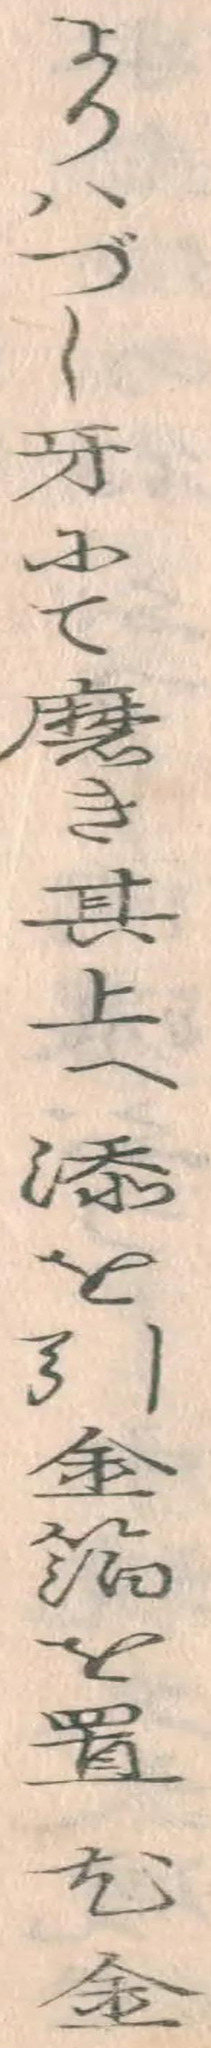よりはづし牙にて磨き其上へ添を引金箔を置尤金
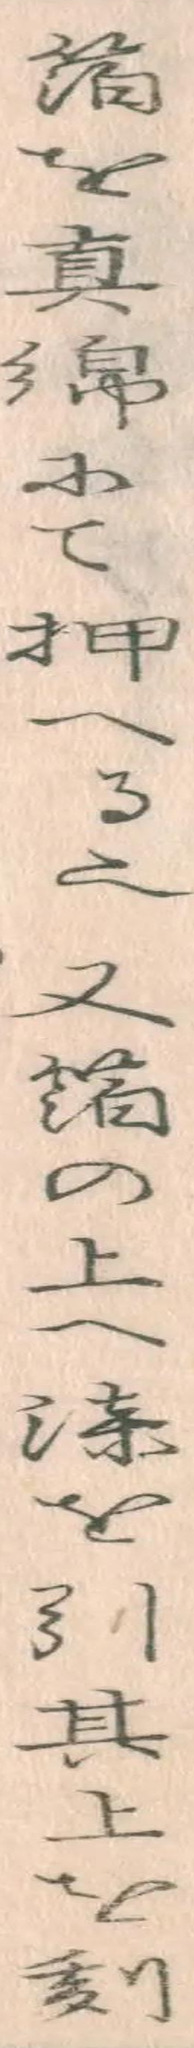箔を真綿にて押へる也又箔の上へ漆を引其上を刻
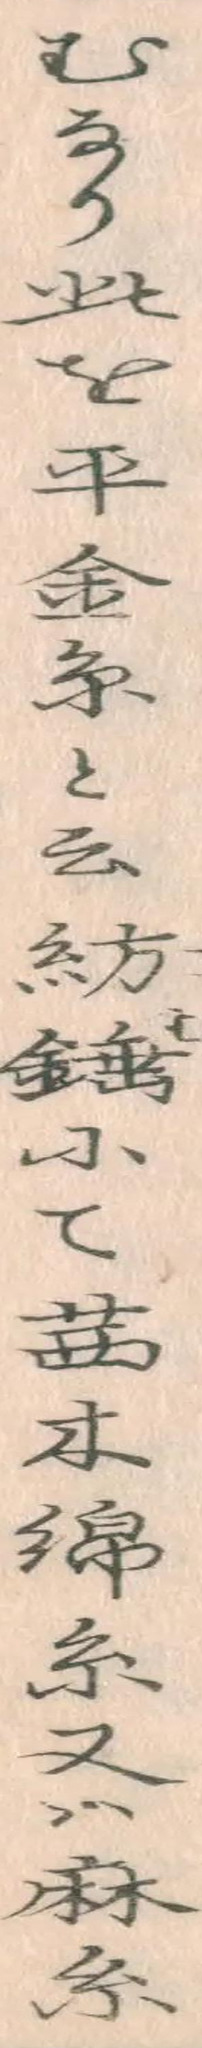むなり此を平金糸と云紡錘にて茜木綿糸又は麻糸
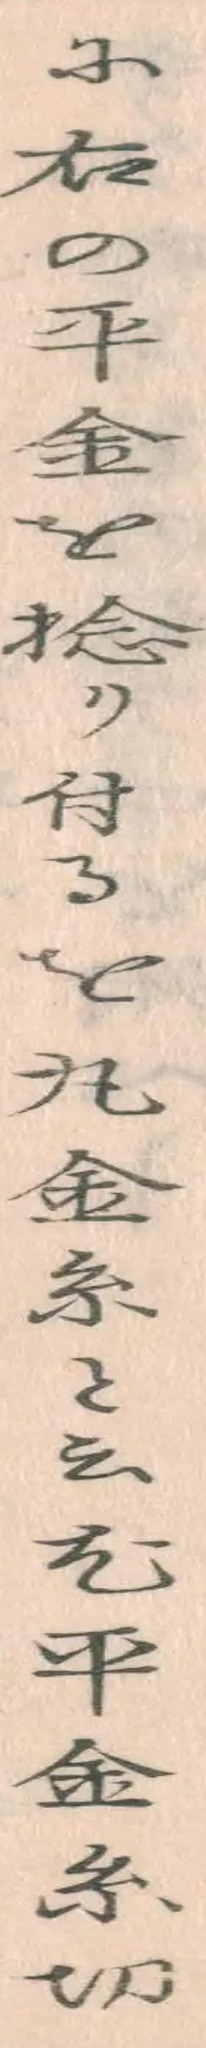に右の平金を捻り付るを丸金糸と云尤平金糸切
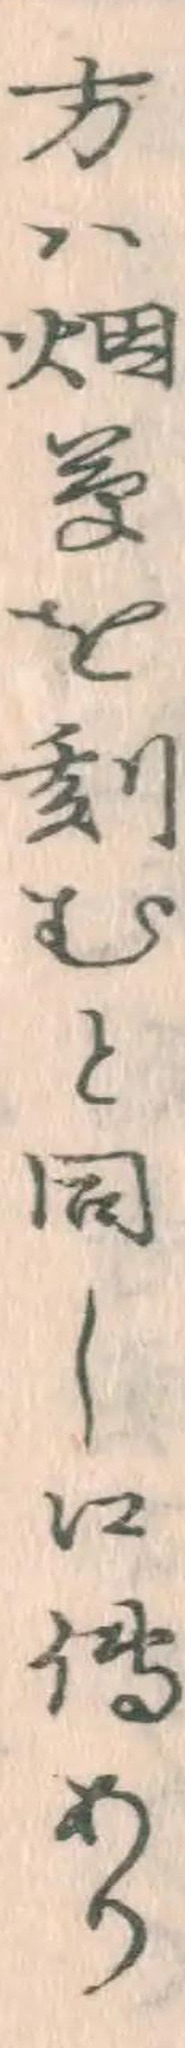方は煙草を刻むと同し口伝あり
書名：機織彙編 5巻. [1]
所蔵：国立国会図書館 National Diet Library, JAPAN
